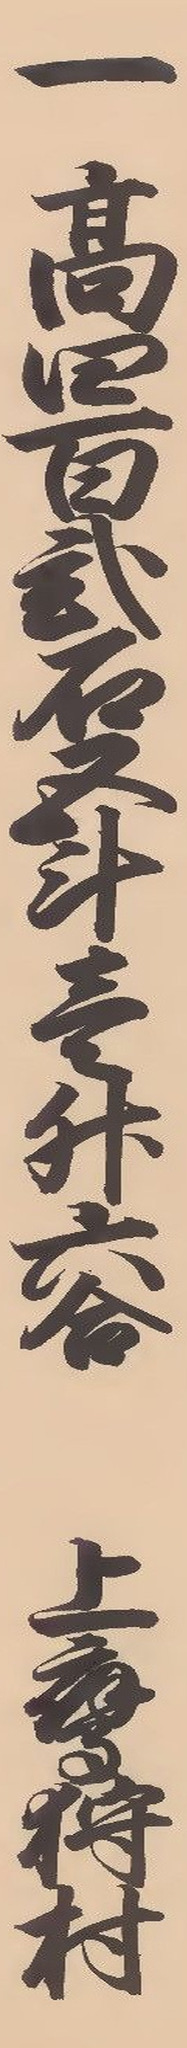一高四百弐石五斗壱升六合上鷹狩村
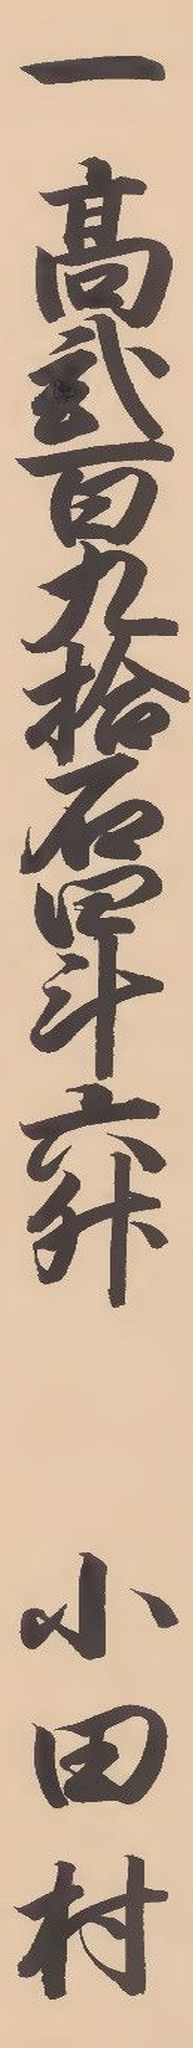一高弐百九拾石四斗六升小田村
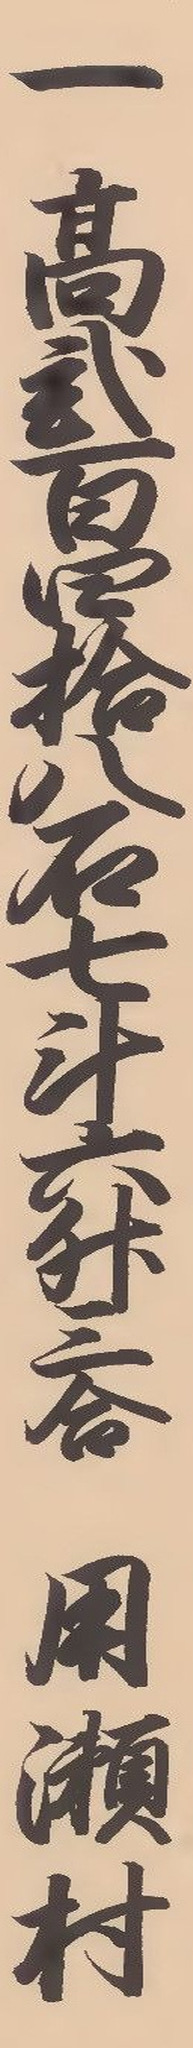一高弐百四拾八石七斗六升三合用瀬村
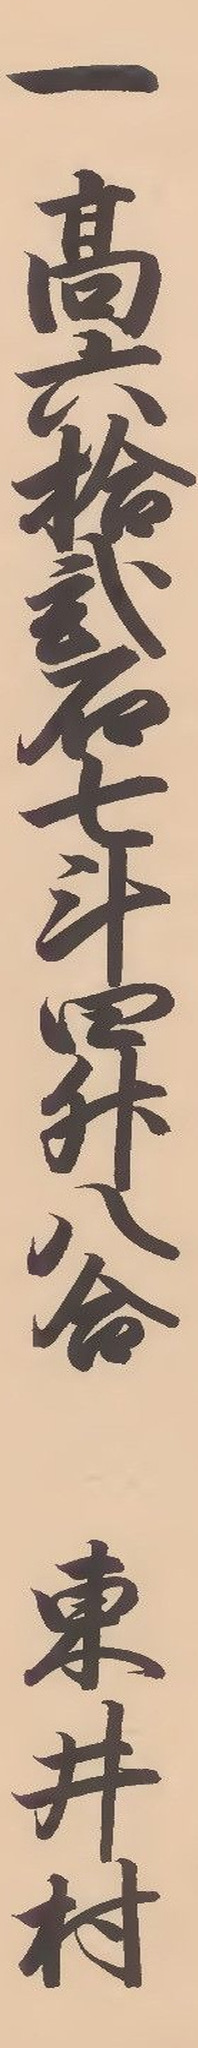一高六拾弐石七斗四升八合東井村

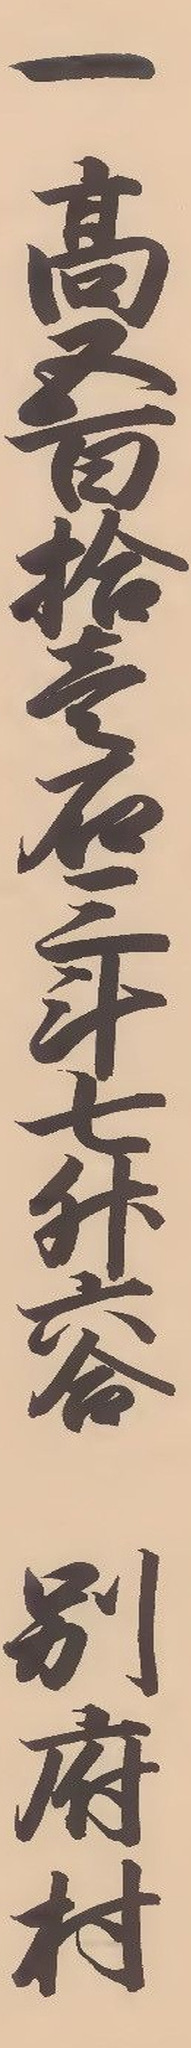一高五百拾壱石三斗七升六合別府村
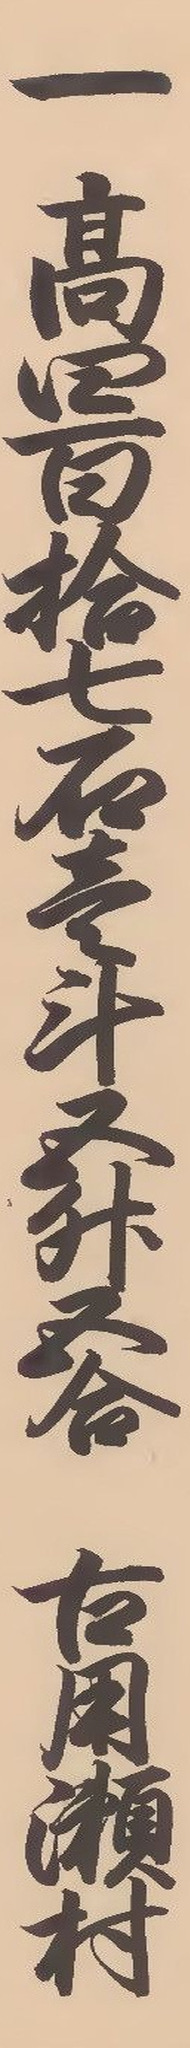一高四百拾七石壱斗五升五合古用瀬村
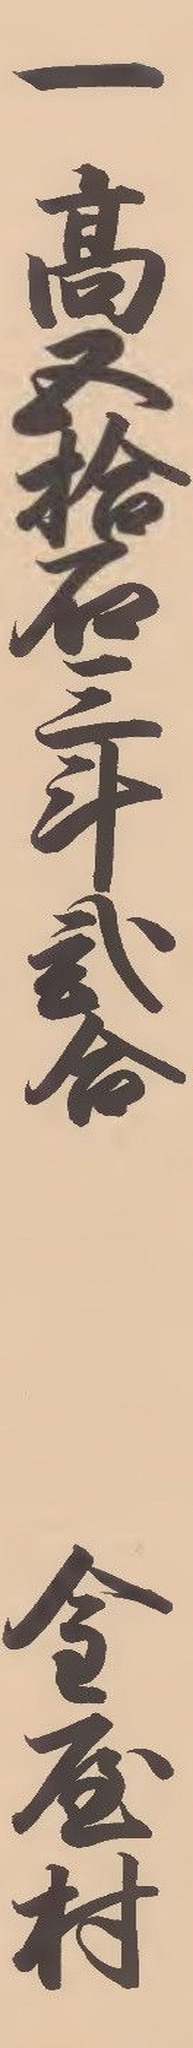一高五拾石三斗弐合金屋村
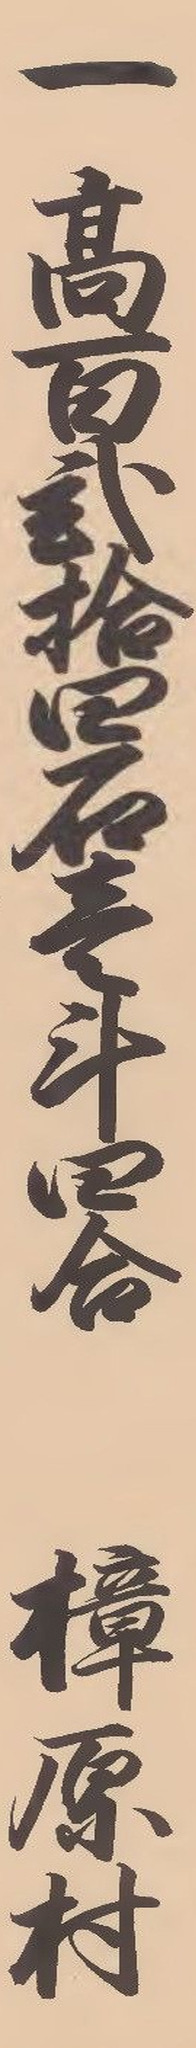一高百弐拾四石壱斗四合樟原村
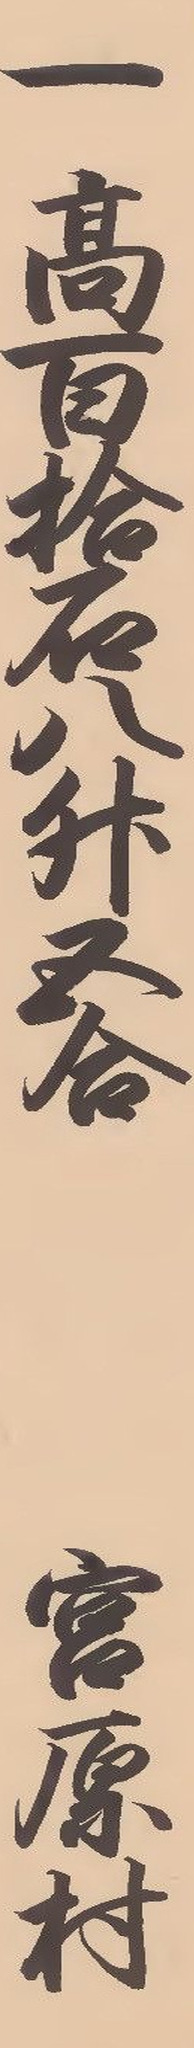一高百拾石八升五合宮原村
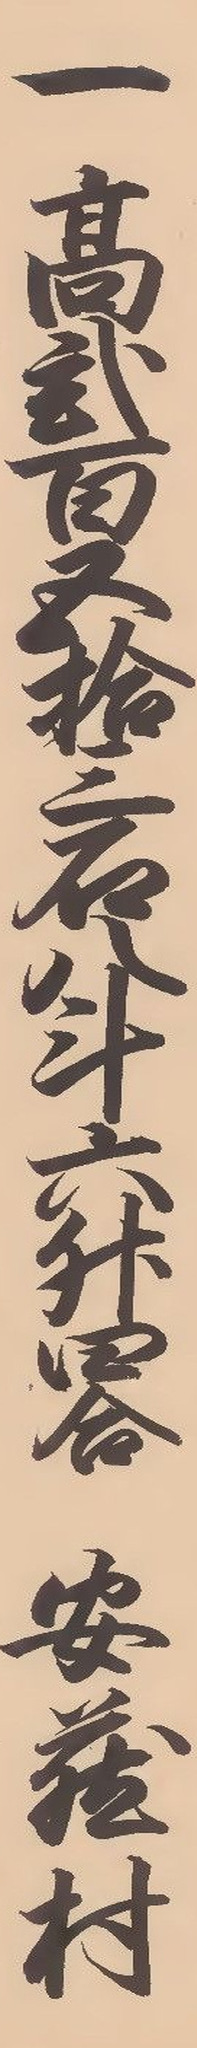一高弐百五拾三石八斗六升四合安蔵村
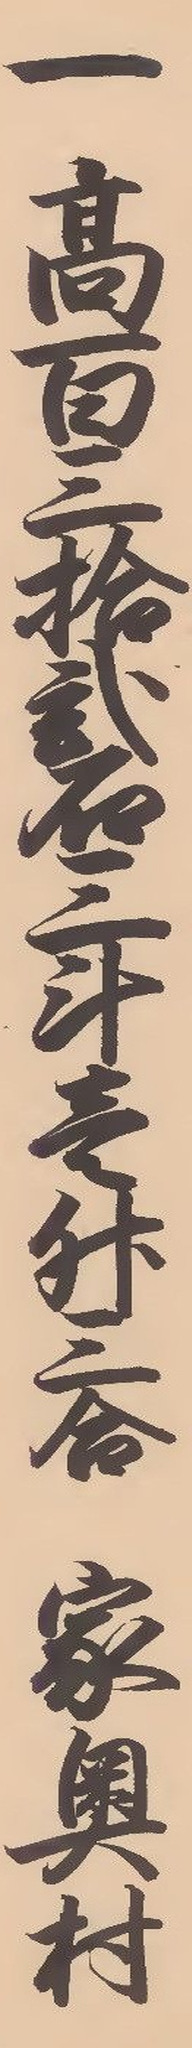一高百三拾弐石三斗壱升三合家奥村

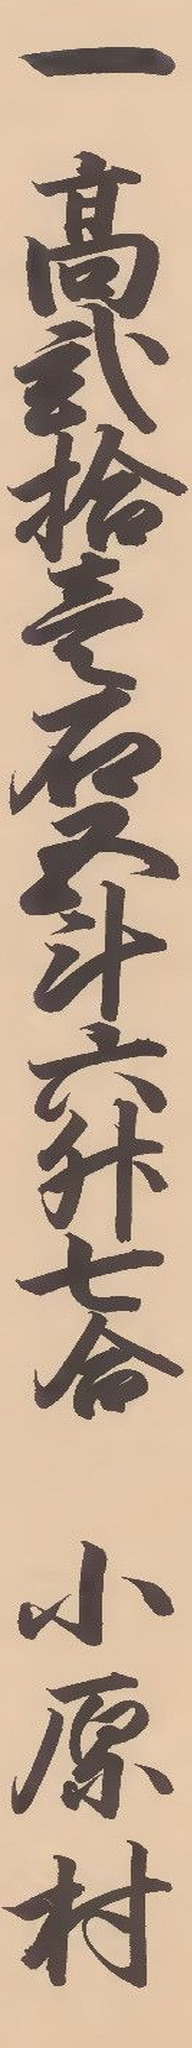一高弐拾壱石五斗六升七合小原村
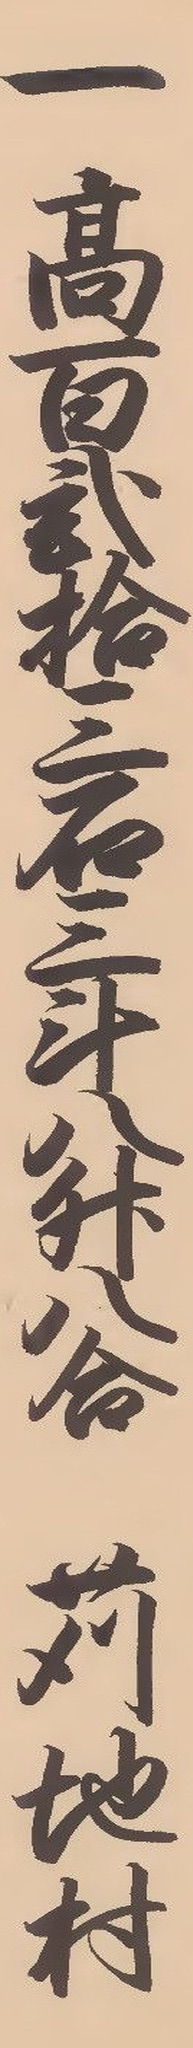一高百弐拾三石三斗八升八合苅地村
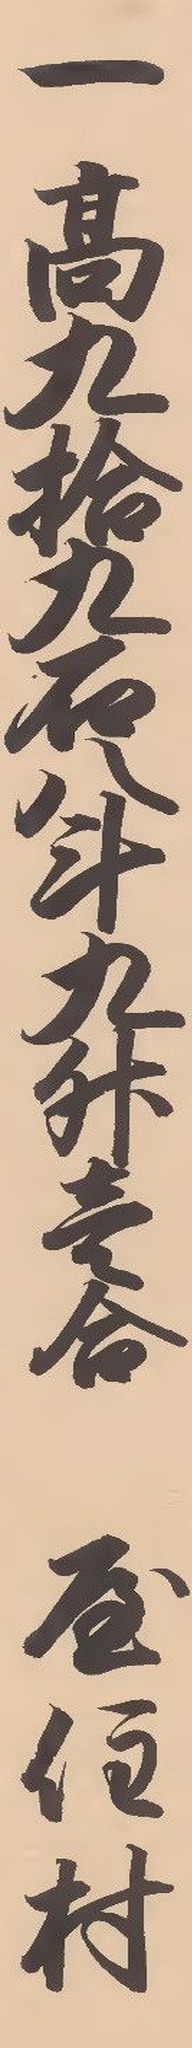一高九拾九石八斗九升壱合屋住村
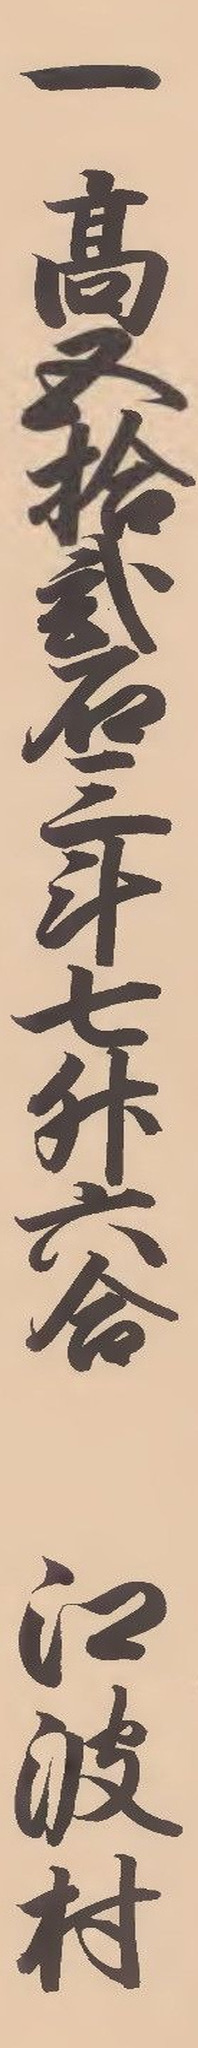一高五拾弐石三斗七升六合江波村
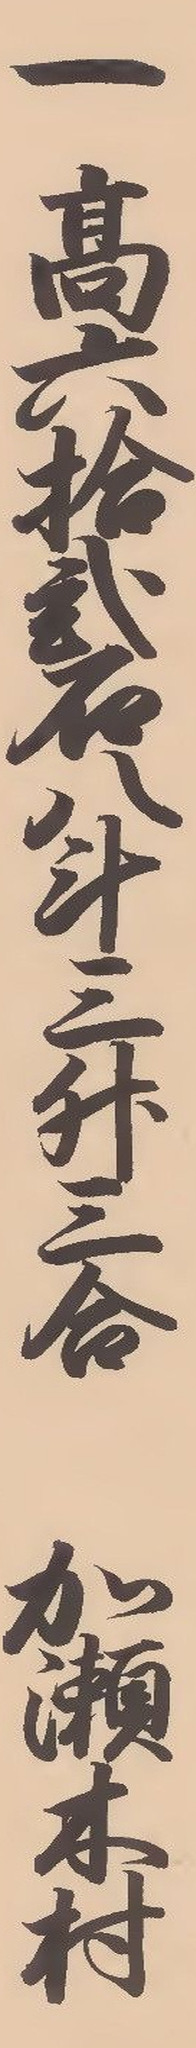一高六拾弐石八斗三升三合加瀬木村
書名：因幡国郷帳
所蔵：国立公文書館 National Archives of Japan
